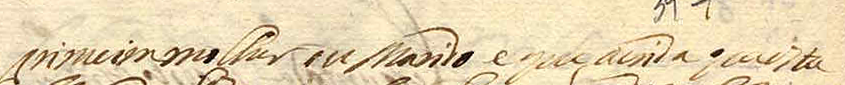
primeira molher ou Marido, e que ainda que os ca
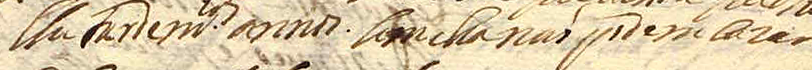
lla tarde m.tos annos. com ella naõ podem cazar
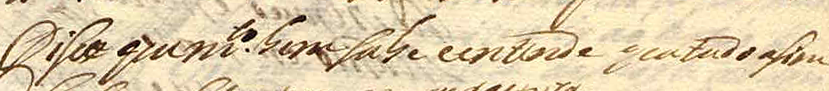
Disse que mto. bem sabe e entende que tudo assim
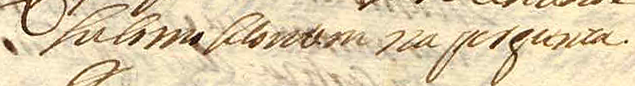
he como a contem na pergunta.
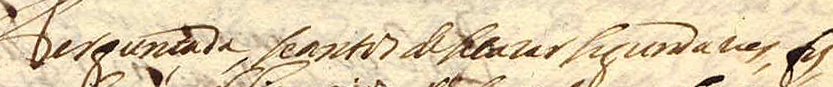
Perguntada se antes de se cazar segunda ves, fez
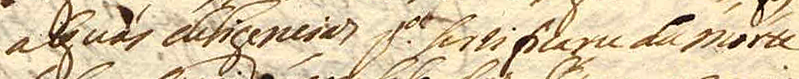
alguās deligencias p.a sertificarse da morte
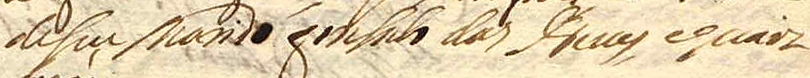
de seu Marido gonsalo das Neues, e quaiz
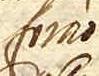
foraõ
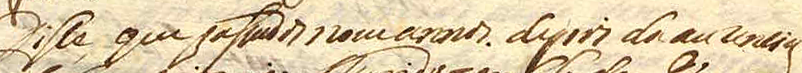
Disse que passados noue annos depois da auzencia
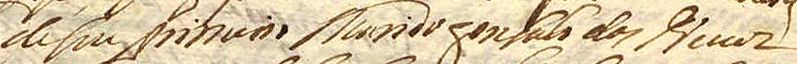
de seu primeiro Marido gonsalo das Neuez
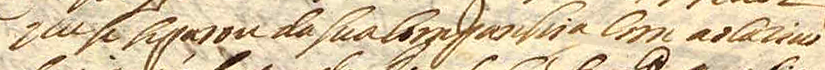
que separou da sua Companhia com a ocaziaõ
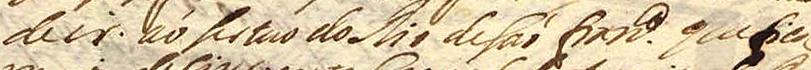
de ir ao Sertao do Rio de saõ fran.co que fica
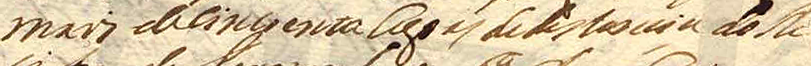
mais de cincoenta legoas de distancia do Re
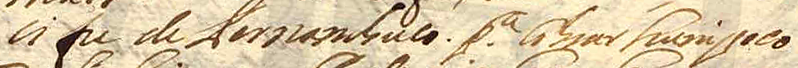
cife de Pernambuco. p.a cobrar hum poco
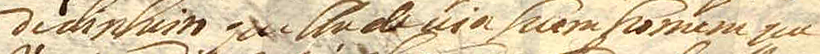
de dinheiro que lhe devia hum homem que
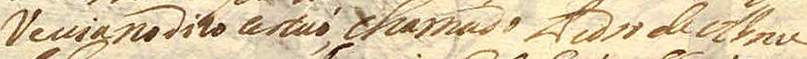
Veuia no dito certaõ, chamado Pedro de Abreu
